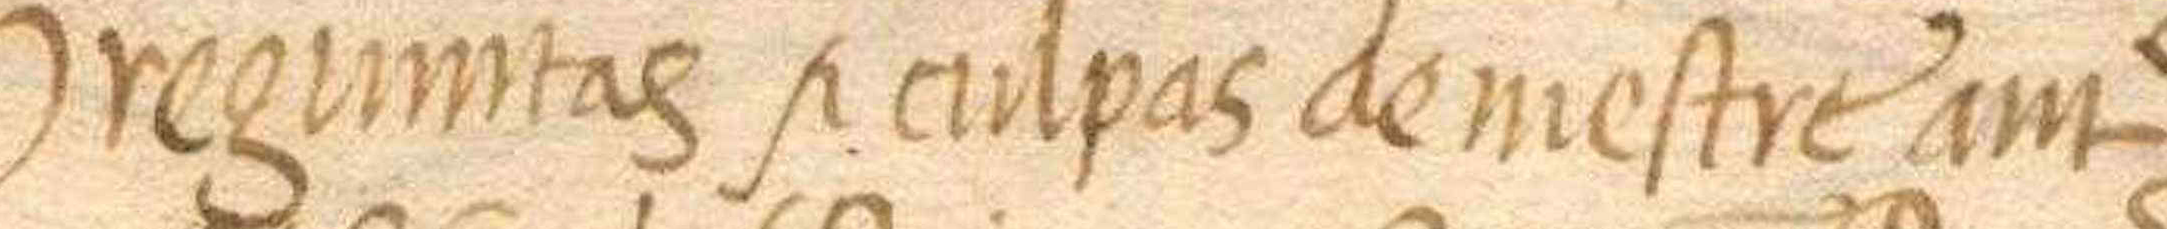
Pregumtas e culpas de mestre anto
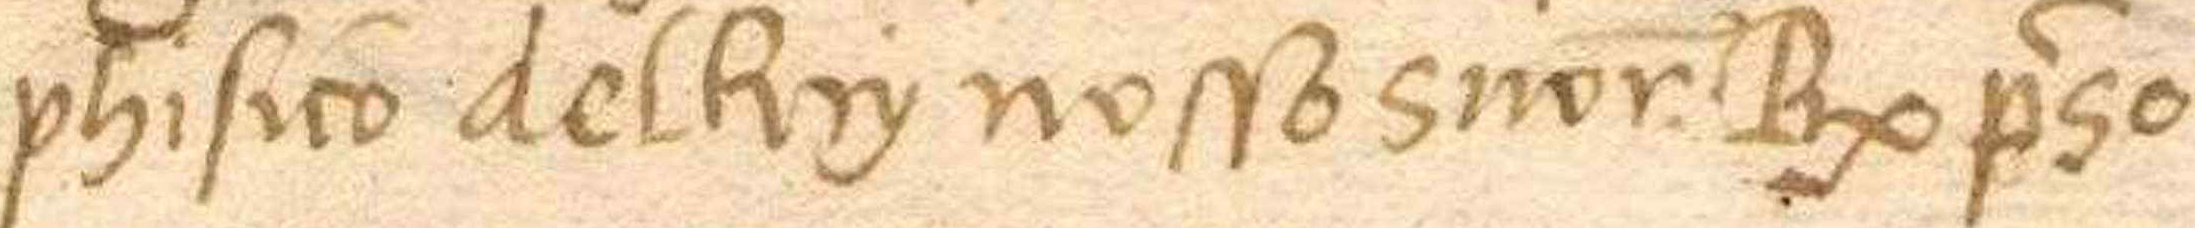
phisico del Rey nosso senōr Rꝭ os̄o
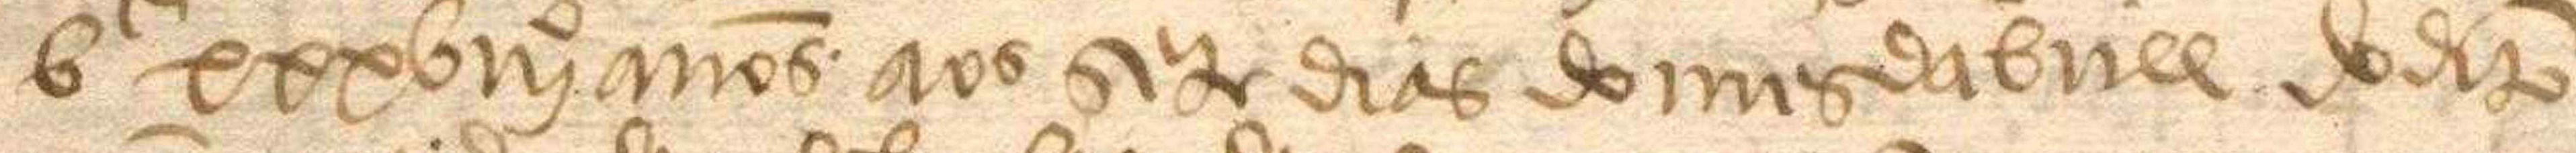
bc xxxbiijo anōs. aos sete dias do mes dabrill do dito
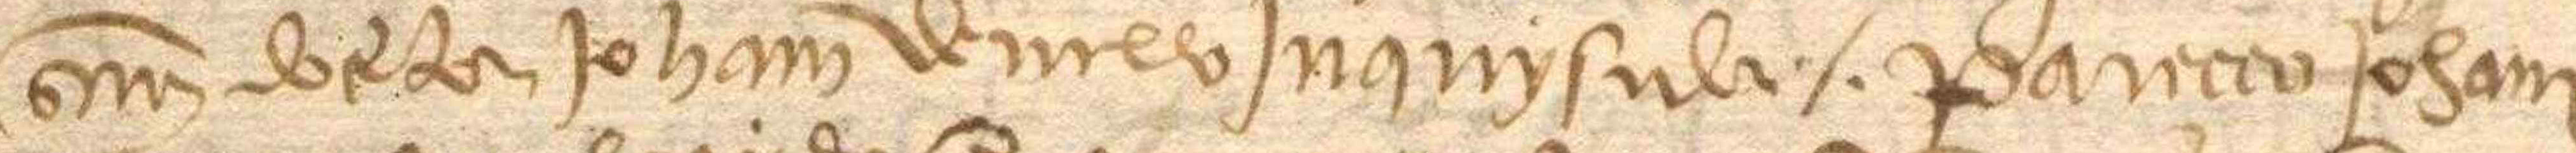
s̄nor doctor Joham de nello Jnquysidor ./. Pareçeo Joham
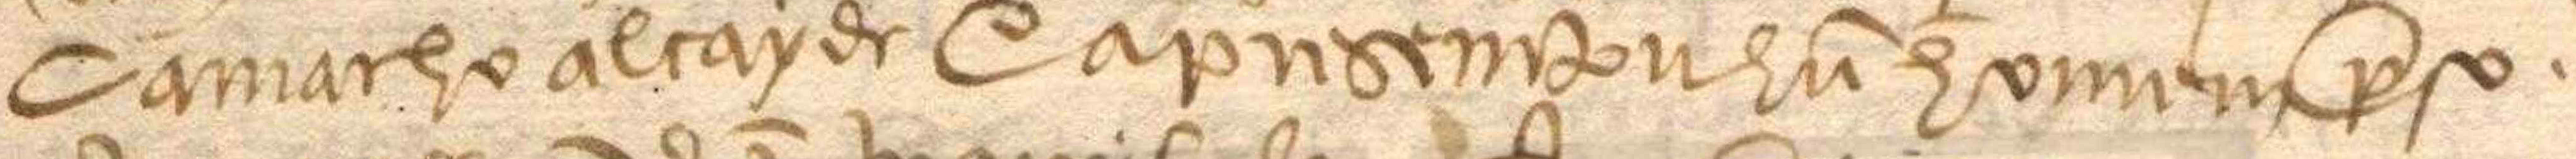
Camacho alcayde e apresemtou hū homem p̄so.
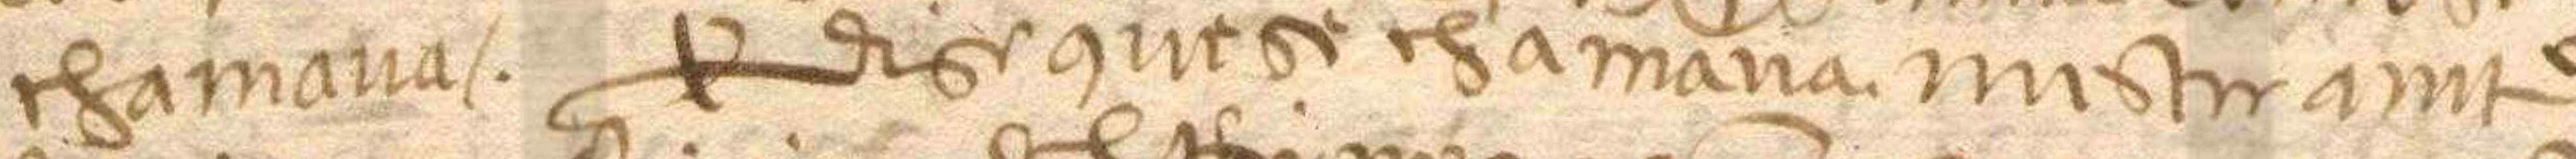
chamaua/. E dise que se chamaua mestre amto
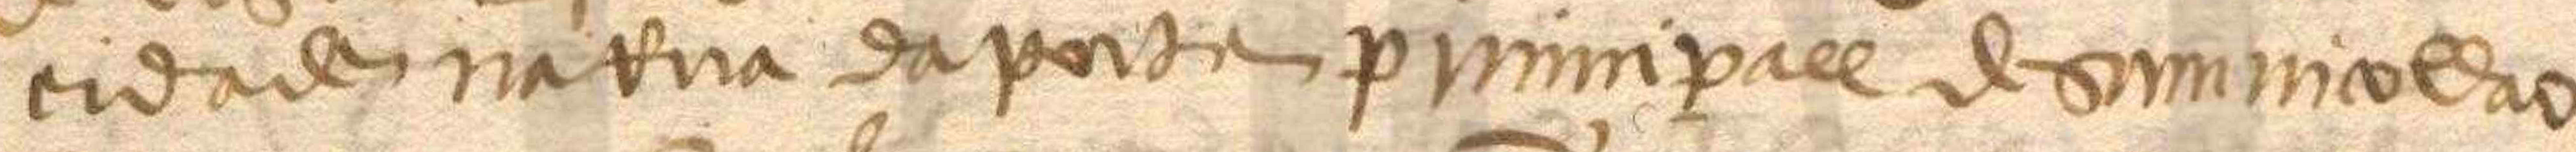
çidade na Rua da porta primçipall de sam nicollao
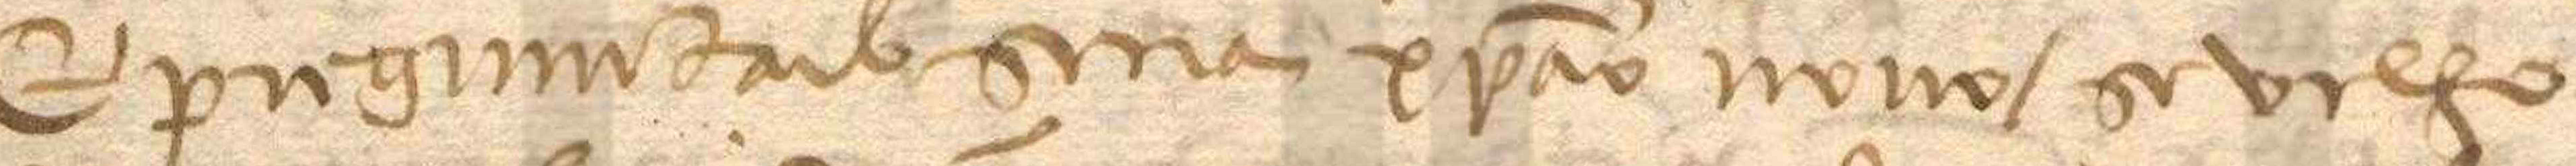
E pregumtado se era xpão nouo/ se velho
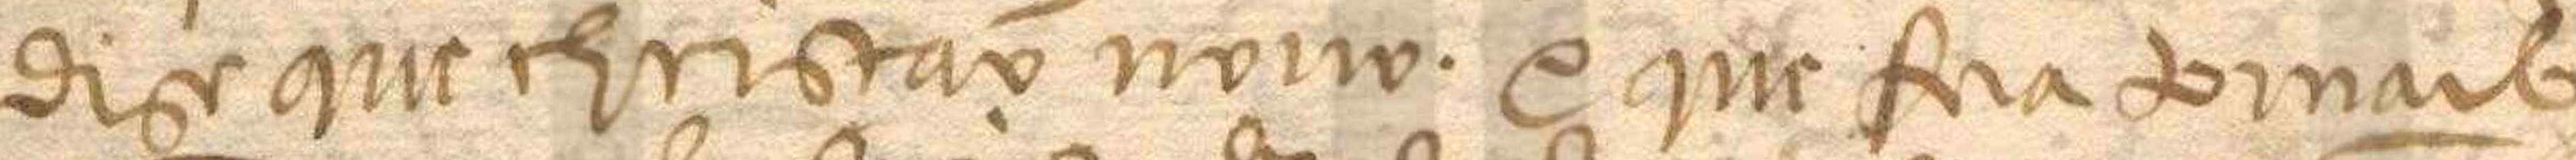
dise que christão nouo. e que fora tornado
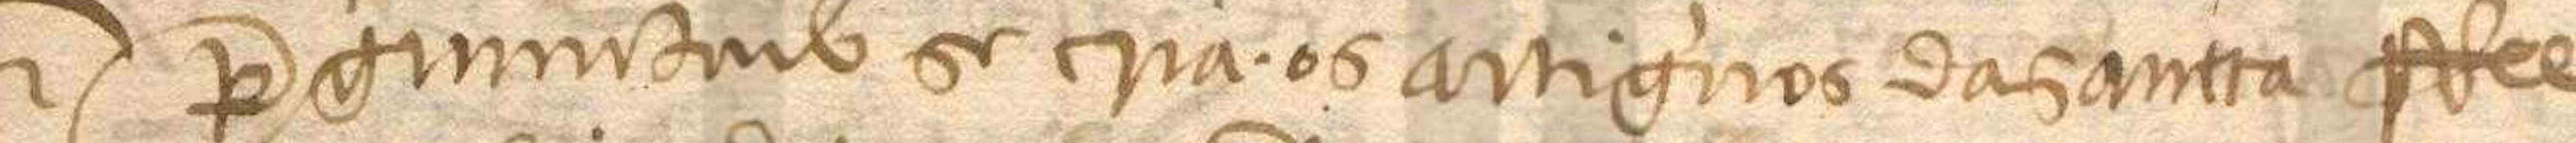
item p̄gumtado se cria. os artiguos da sancta ffee
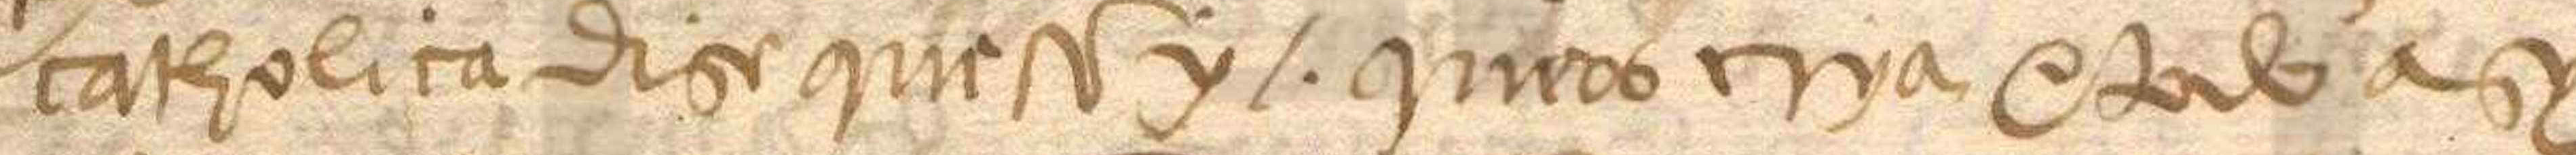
catholica dise que ssy /. que os crya e todo asy
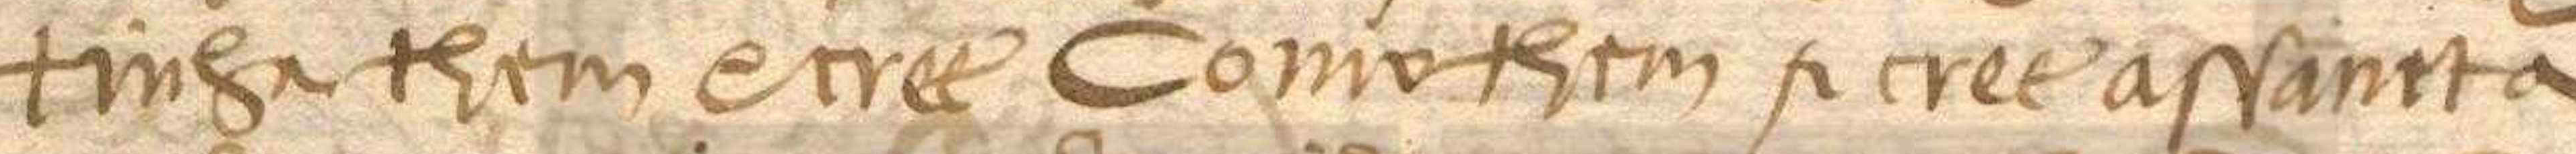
tinha them e cree Como them e cree a ssancta
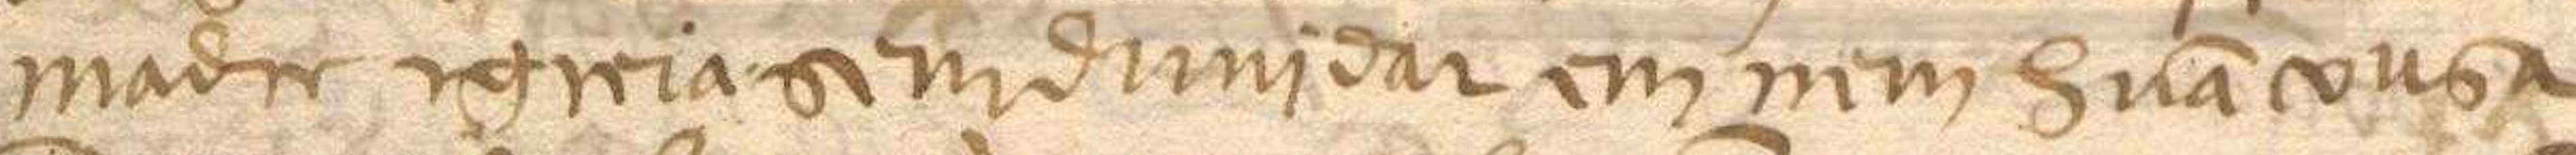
madre egreia sem duujdar em nem huā cousa
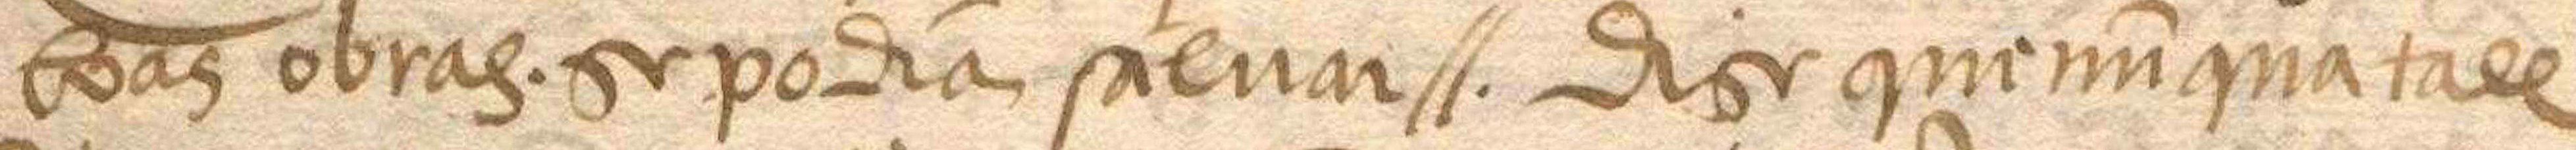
boas obras. se podia saluar //. dise que nūqua tall
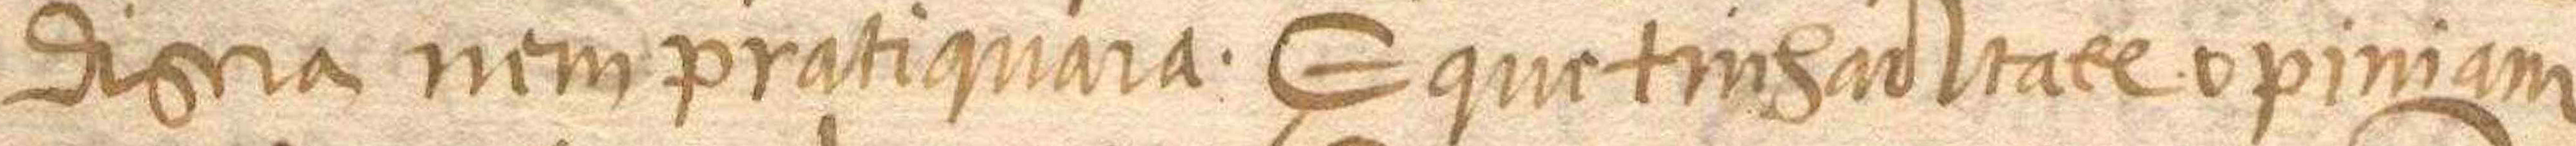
disera nem pratiquara. E que tinha A tall opiniam
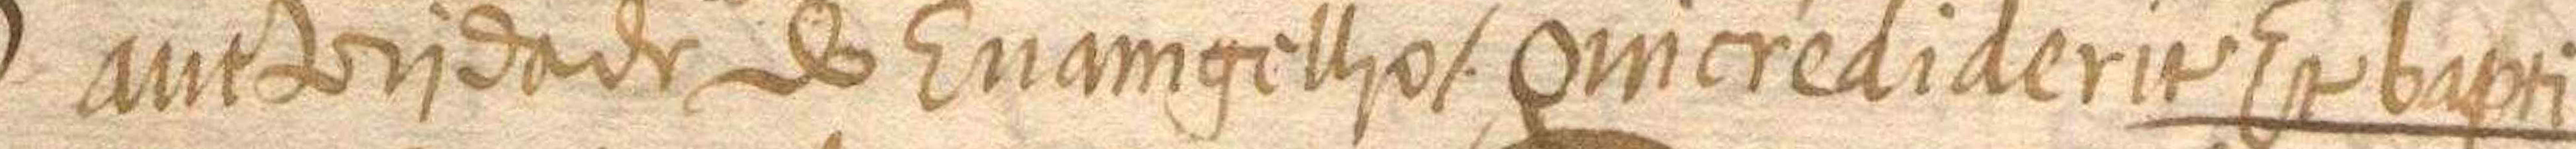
auctorjdade do Euamgelho/. Qui crediderit Et bapti
